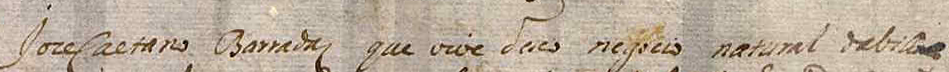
Joze Caetano Barradas que vive de seo negocio natural da Villa
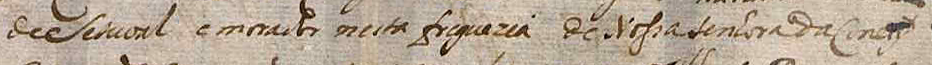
de Setuval e morador nesta freguezia de Nossa senhora da Concey
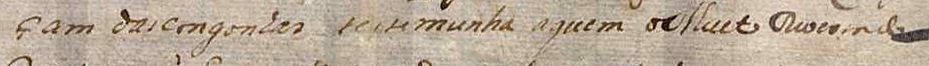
çam das congonhas testemunha a quem o Muito Reverendo
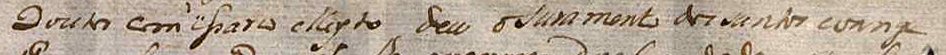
Doutor comissario elleyto deu o Iuramento dos santos evange
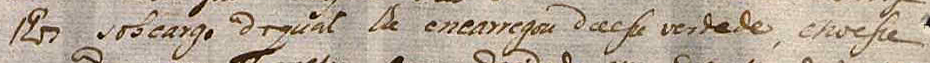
lhos sob cargo do qual lhe encarregou decese verdade, e tivesse
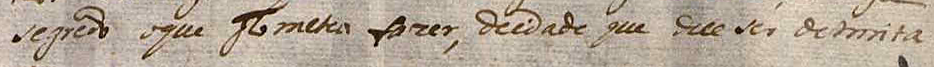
segredo o que prometeo fazer, de idade que dice ser de trinta
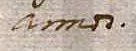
annos.
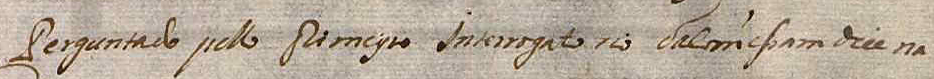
Perguntado pello primeyro Interrogatorio da com̄issam dice na
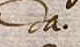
da.
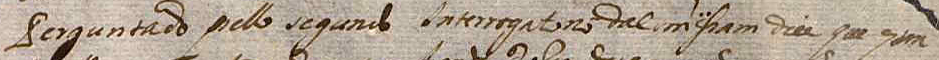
Perguntado pello segundo Interrogatorio da com̄issam dice que estan
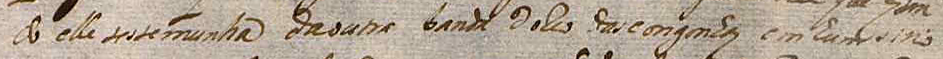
do elle testemunha da outra banda do Rio das congonhas em hum sitio
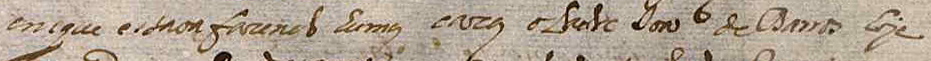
em que estava fazendo humas cazas o Padre Ioaõ de Barros hoje
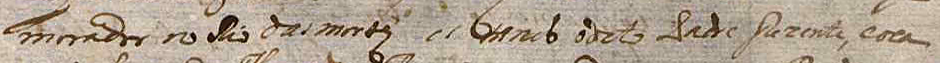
morador no Rio das mortes estando o dito Padre pRezente, e o ca
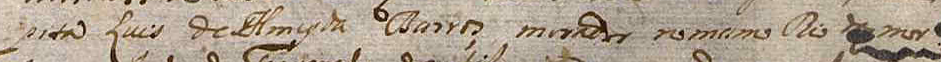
pitā Luis de Almeyda Barros, morador no mesmo Rio das mor
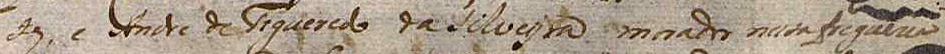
tes, e Andre de Figueredo da Silveyra morador nesta freguezia
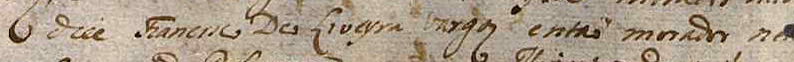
dice Francisco De oLiveyra vargas entaõ morador na
